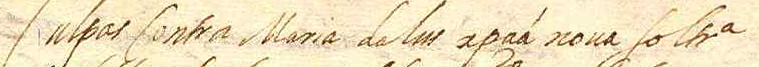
Culpas Contra Maria da lus xpaá noua soltra
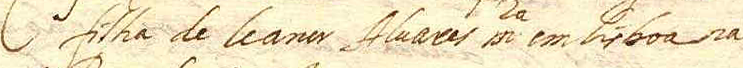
filha de Leanor Aluares mra em Lisboa na
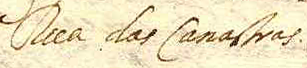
Rua das Canastras.
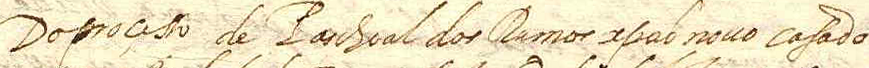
Do proçesso de Paschoal dos Ramos xpaõ nouo casado
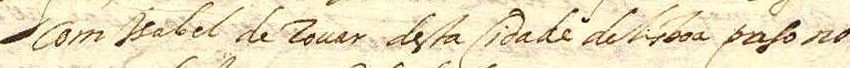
com Isabel de Touar desta Cidade de Lisboa preso no
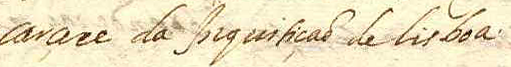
carcere da Jnquisiçaõ de Lisboa.
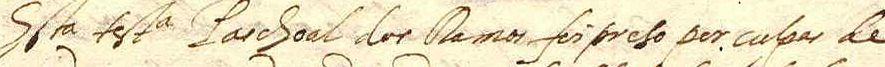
Esta testa Paschoal dos Ramos foi preso por culpas de
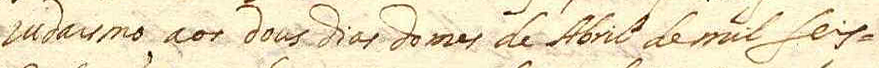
iudaismo aos dous dias do mes de Abril de mil seis
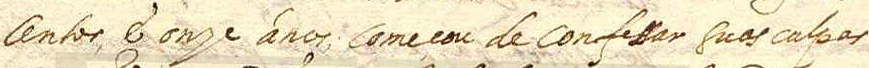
Centos, & onze ānos; começou de confessar suas culpas
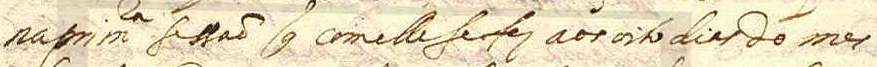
na primra sessaõ q̄ com elle se fez aos oito dias do mes
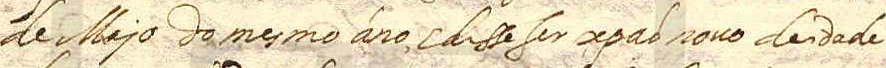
de Majo do mesmo āno, e disse ser xpaõ nouo de idade
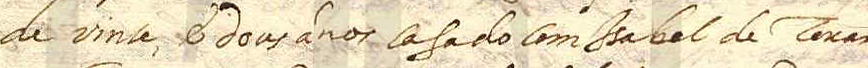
de vinte, & dous ānos casado com Jsabel de Touar
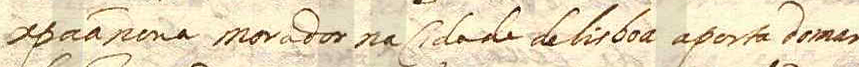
xpaã noua morador na Cidade de lisboa a porta do mar
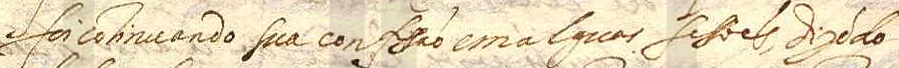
foi cõntinuando sua confissaõ em alguas sessoes̄, dizẽdo
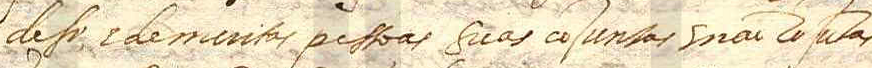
de si, e de muitas pessoas suas cõjuntas e não cõjūtas
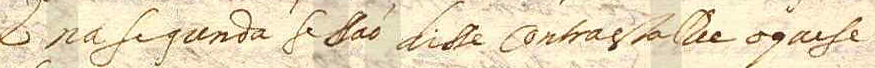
& na segunda sessaõ disse contra esta Ree o que se
